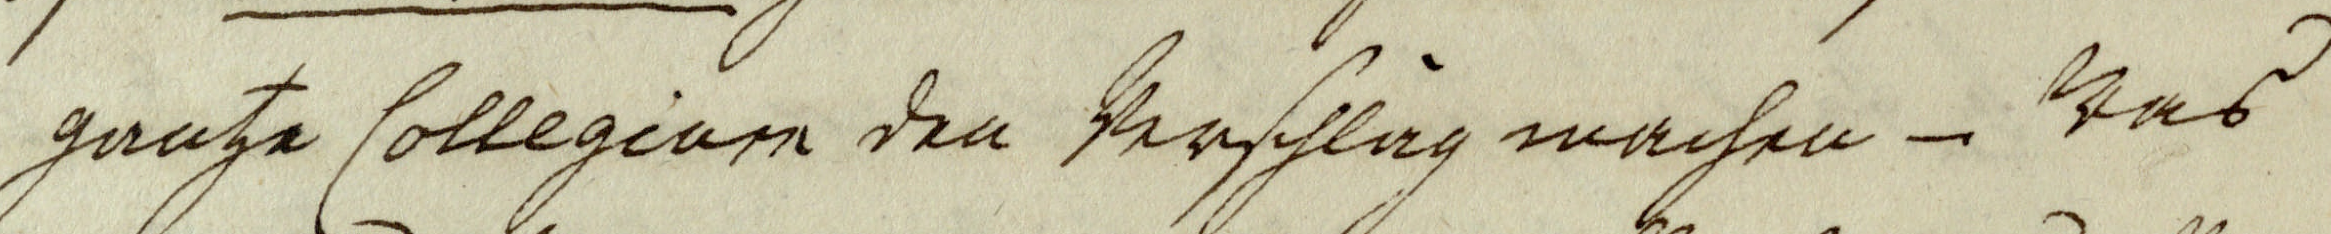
gantze Collegium den Vorschlag machen — Was
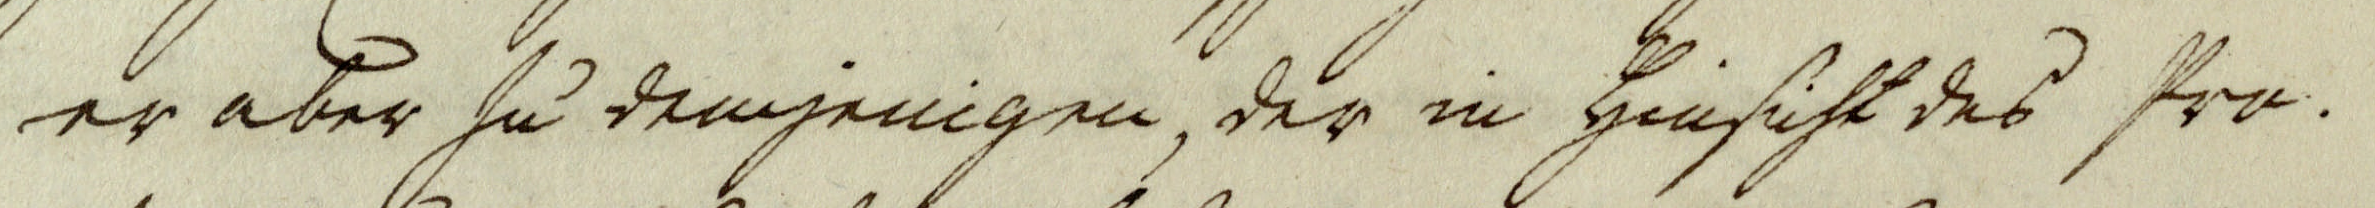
er aber zu demjenigen, der in Hinsicht des Pro¬
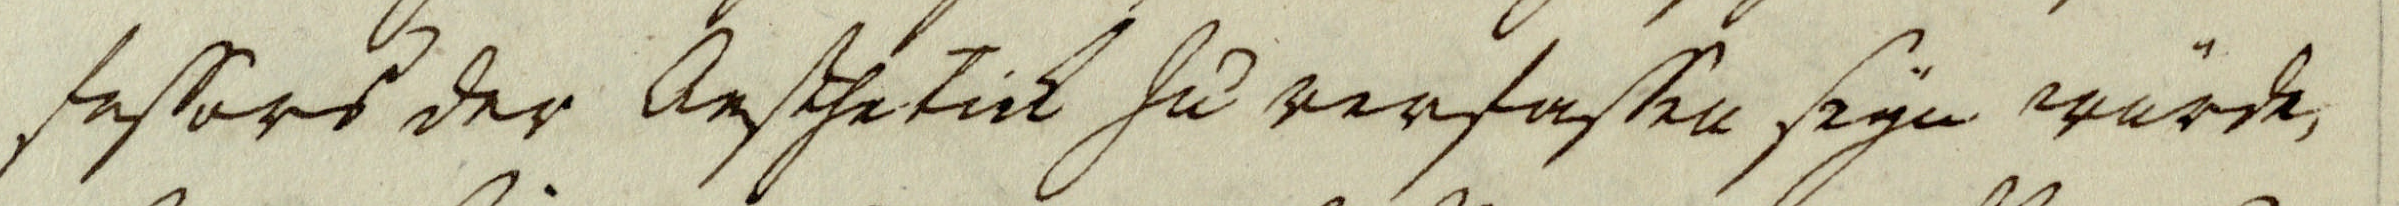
fessors der Aesthetik zu verfassen seÿn würde,
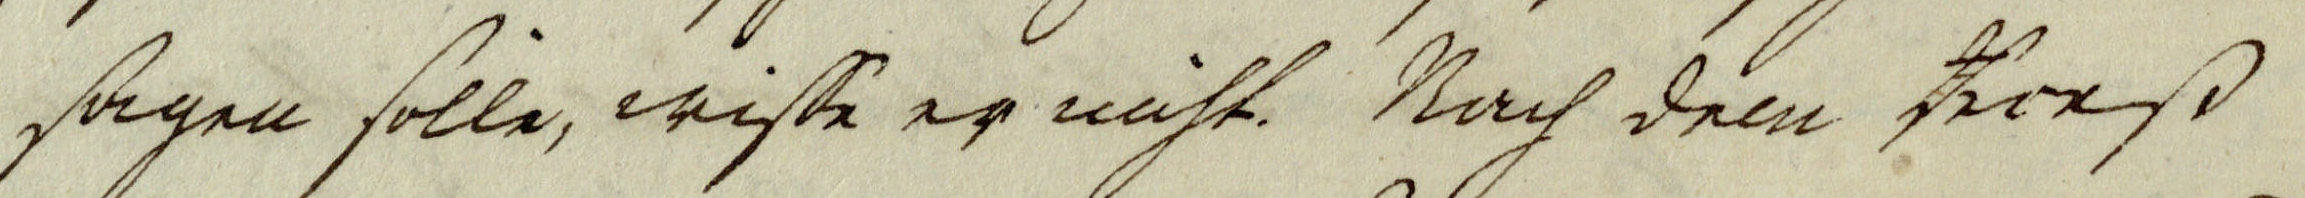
sagen solle, wisse er nicht. Nach dem Receß
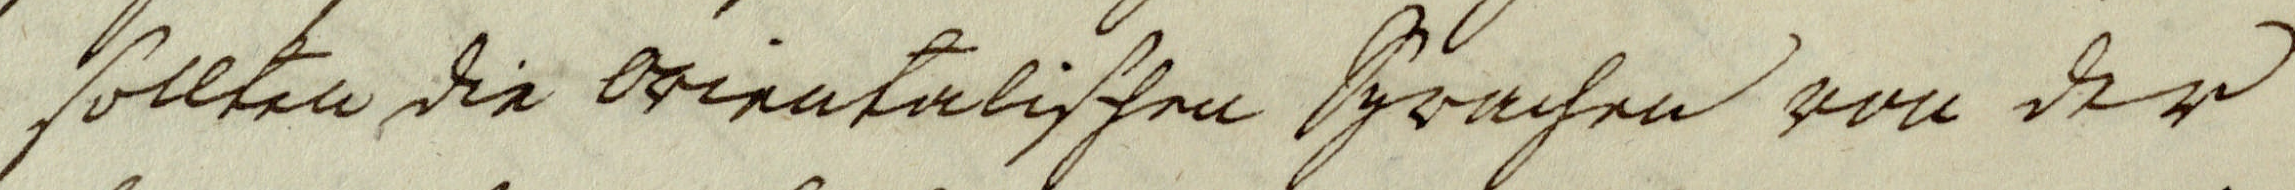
sollten die orientalischen Sprachen von der
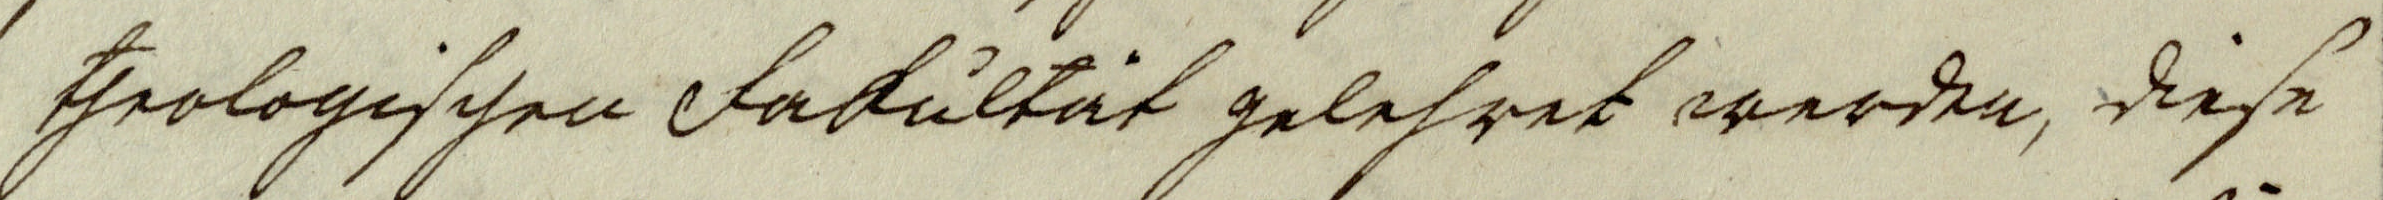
theologischen Fakultät gelehret werden, diese
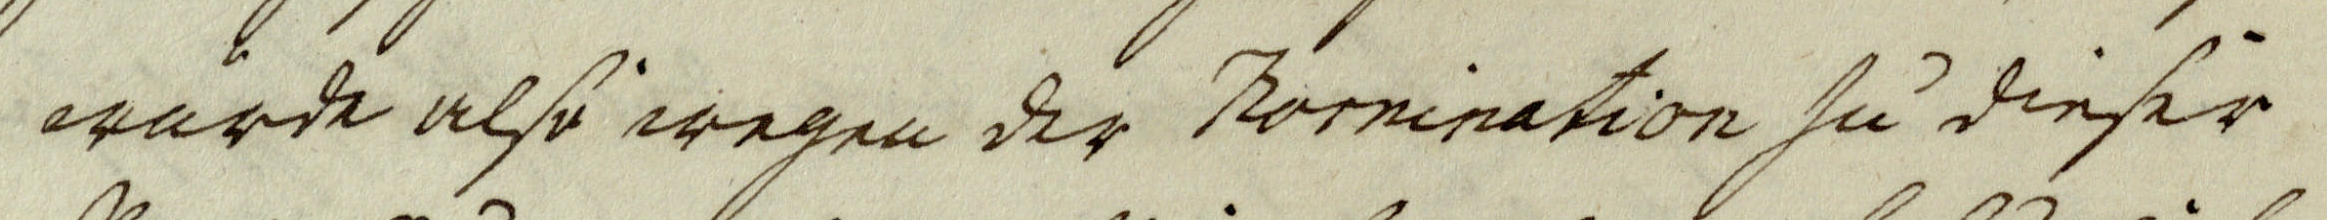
würde also wegen der Nomination zu dieser
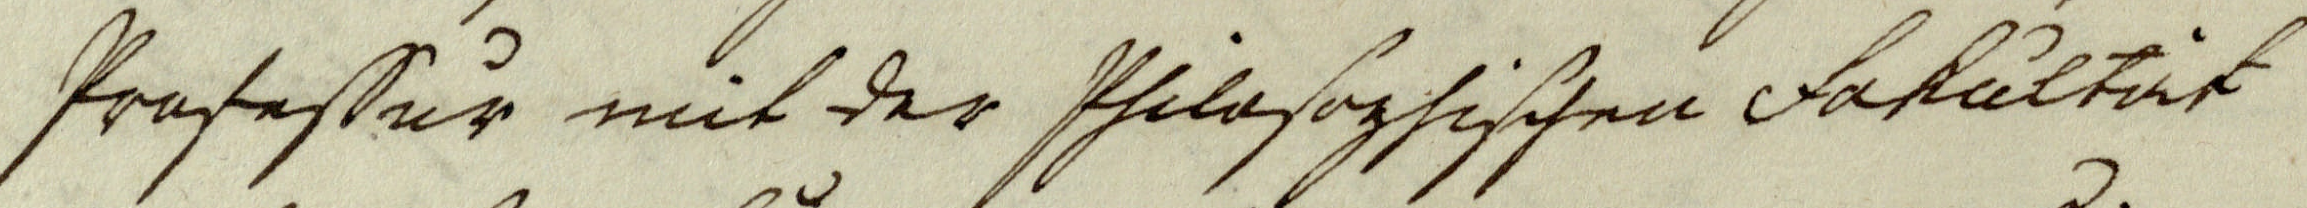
Professur mit der Philosophischen Fakultät
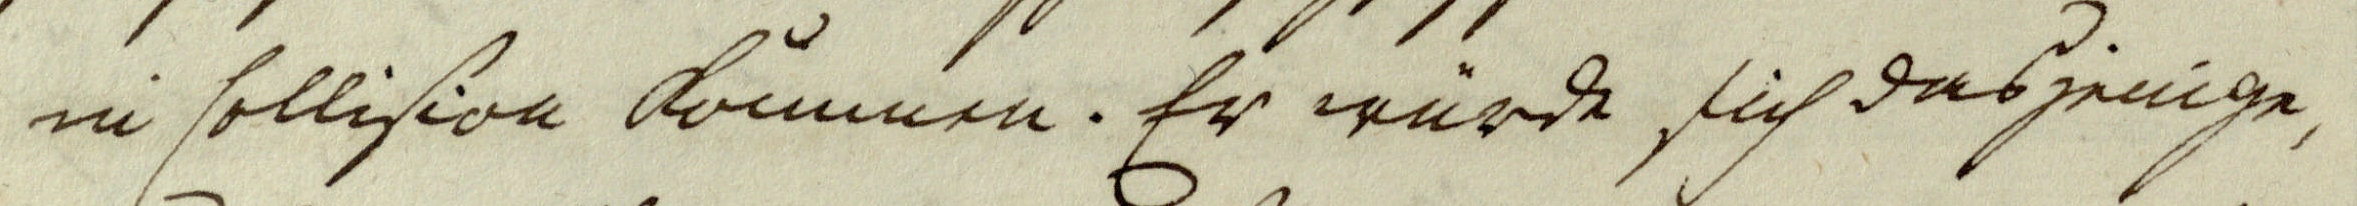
in Collision kommen. Er würde sich dasjenige,
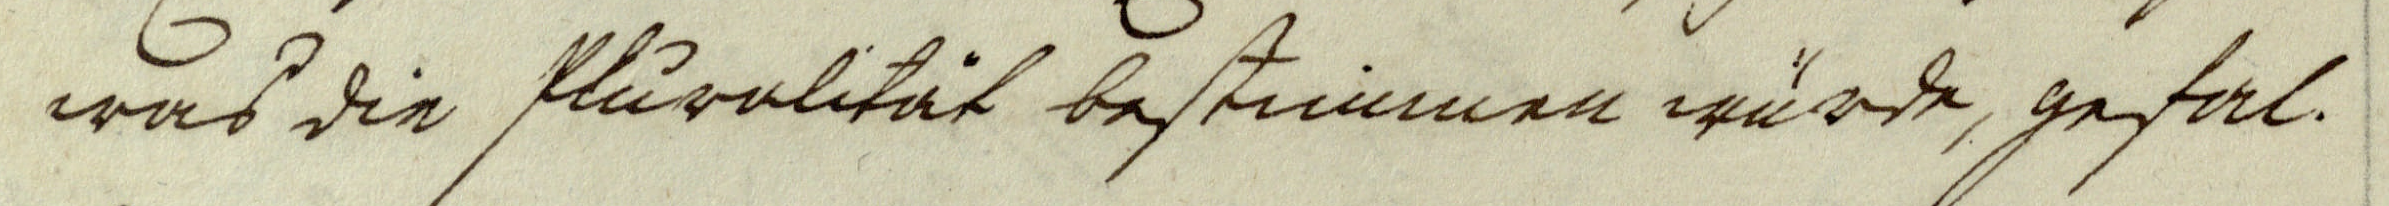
was die Pluralität bestimmen würde, gefal¬
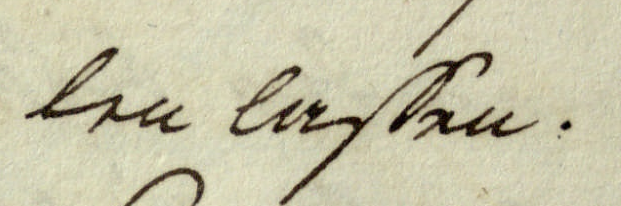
len lassen.
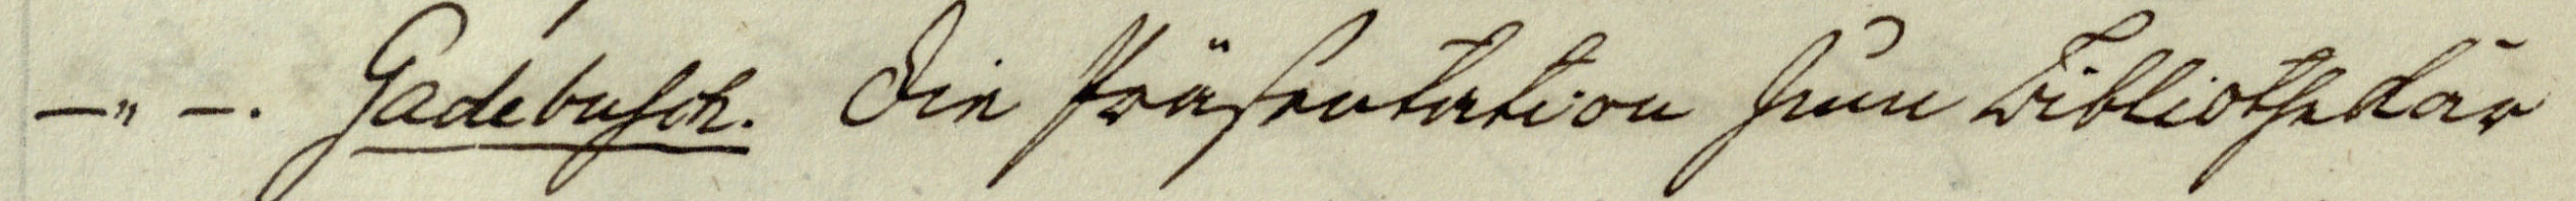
— " — . Gadebusch. Die Präsentation zum Bibliothekar
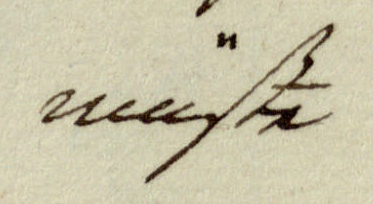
müsste
